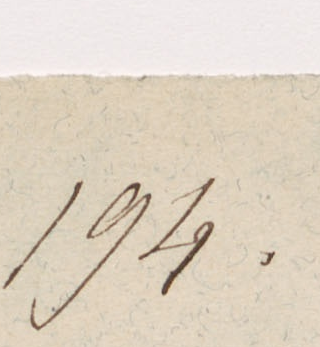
194.
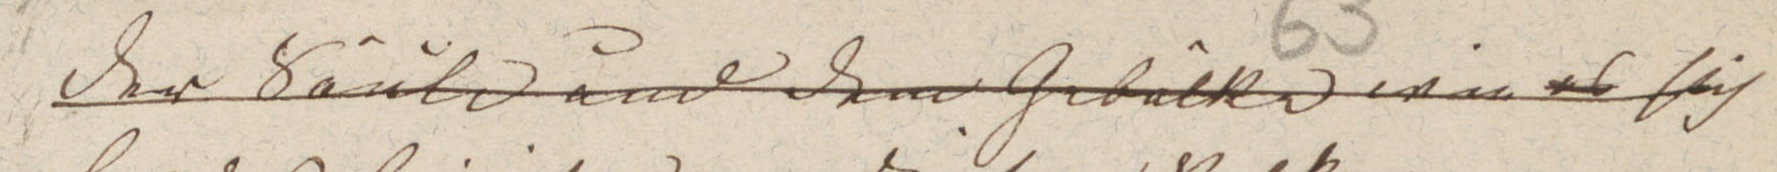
der Säule und dem Gebälke wie es sich
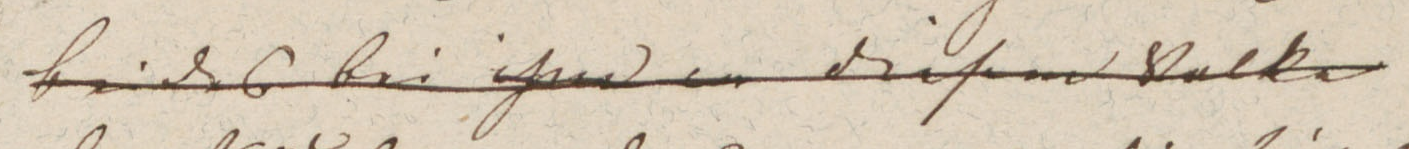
beides bei ihm in diesem Volke
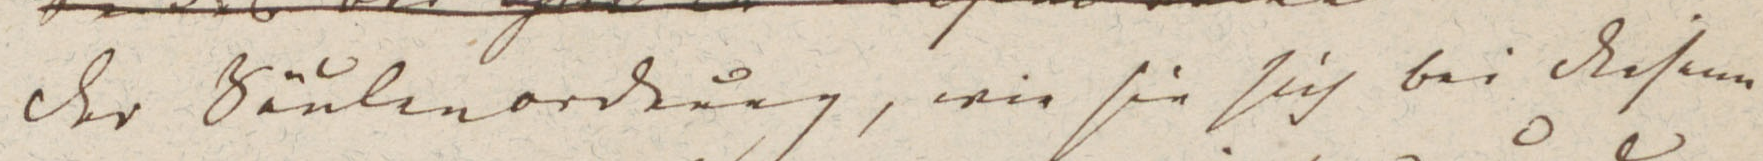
der Säulenordnung, wie sie sich bei diesem
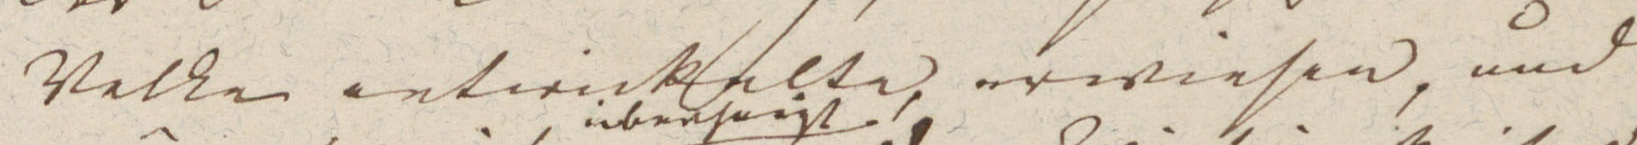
Volke entwickelte, erwiesen, und
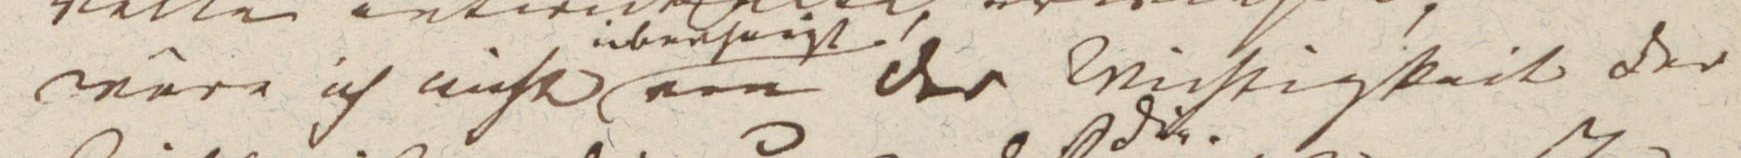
wäre ich nicht überzeugt von der Wichtigkeit der
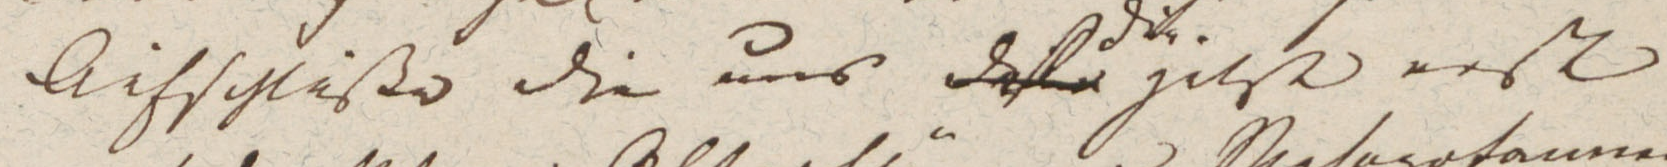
Aufschlüsse die uns diese die jetzt erst
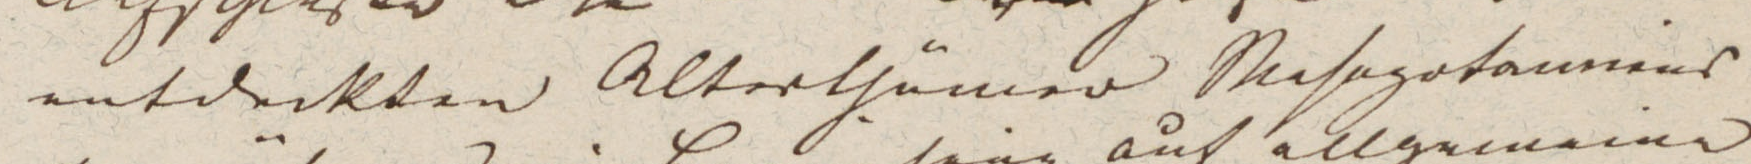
entdeckten Alterthümer Mesopotamiens
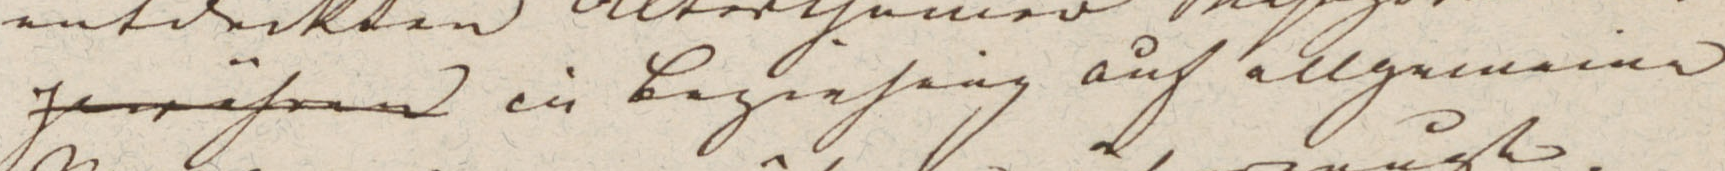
gewähren in Beziehung auf allgemeine
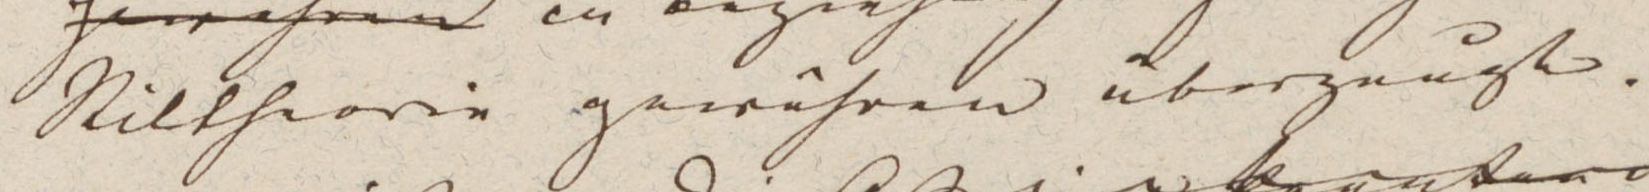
Stiltheorie gewähren überzeugt.
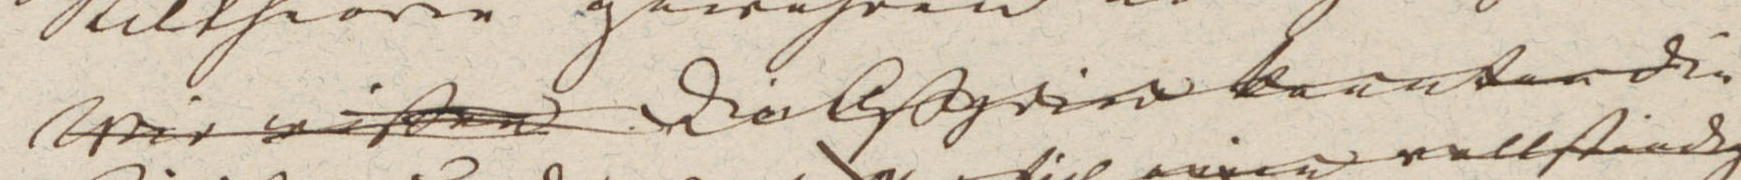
Wir wissen Die Assyrier kannten die
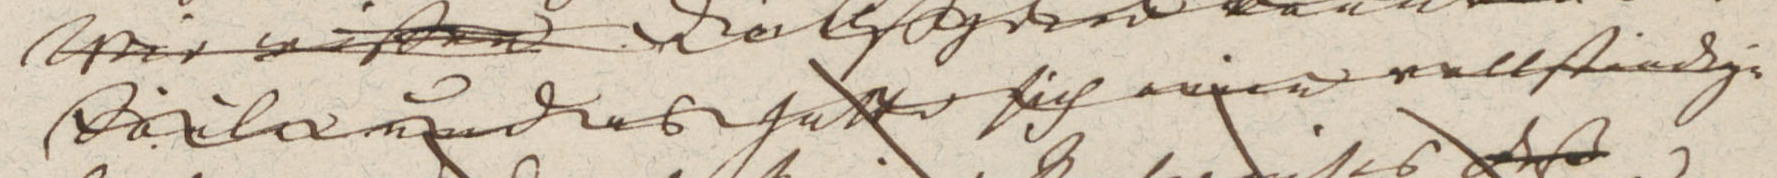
Säule und es hatte sich einen vollständige
